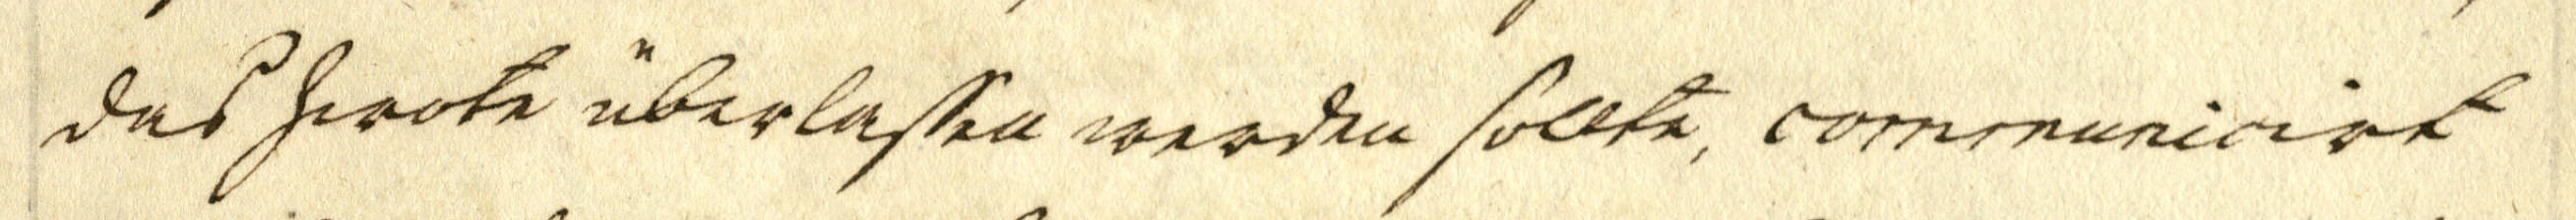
das zwote überlassen werden sollte, communicirt
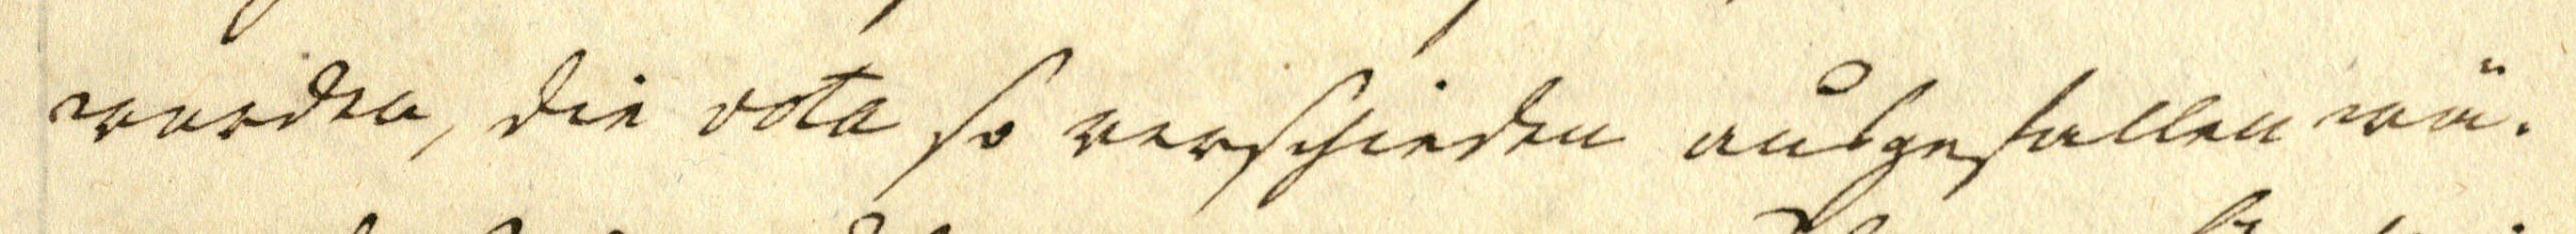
wurden, die vota so verschieden ausgefallen wä¬
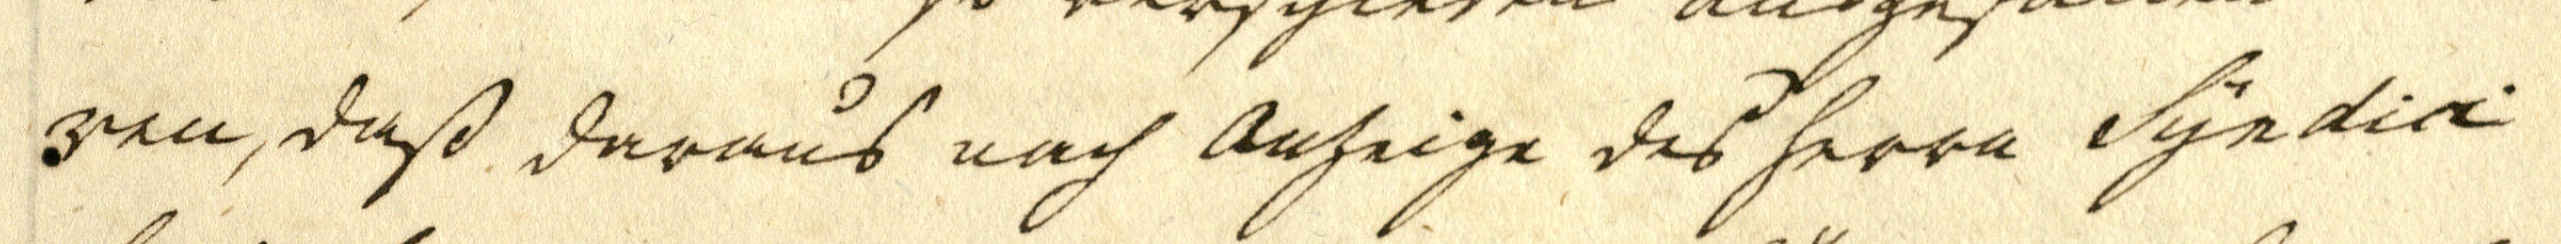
ren, daß daraus nach Anzeige des herrn Sÿndici
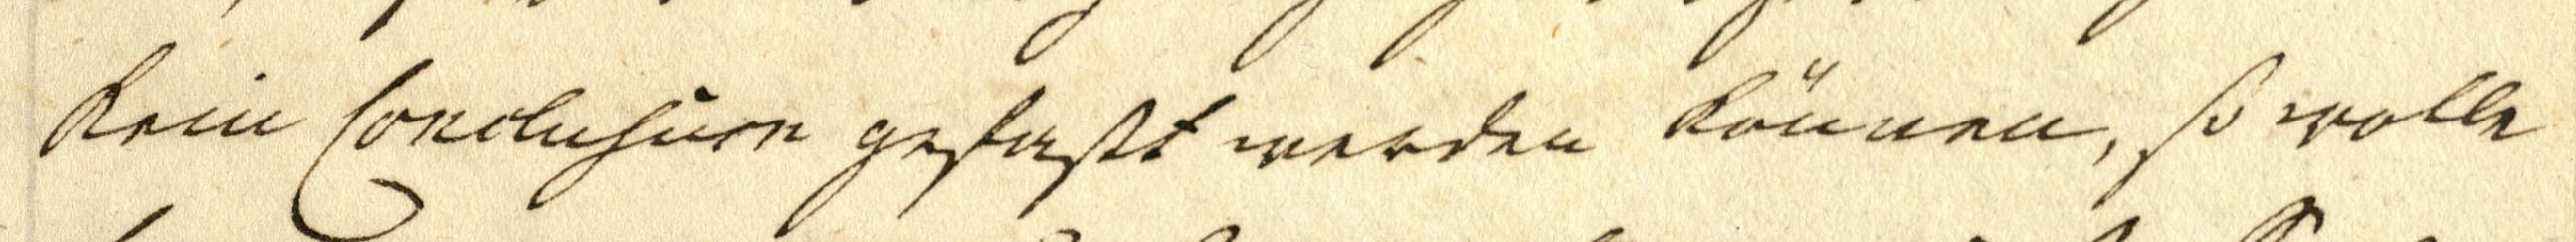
kein Conclusum gefaßt werden können, so wolle
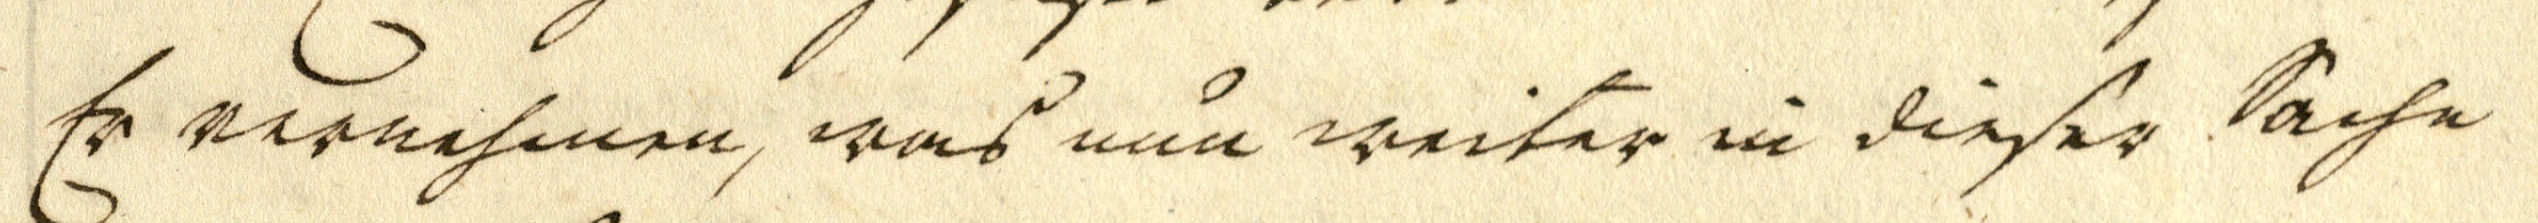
Er vernehmen, was nun weiter in dieser Sache
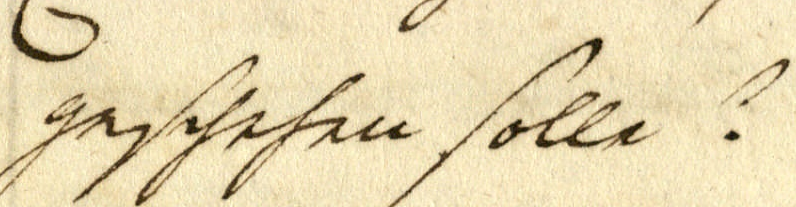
geschehen solle?
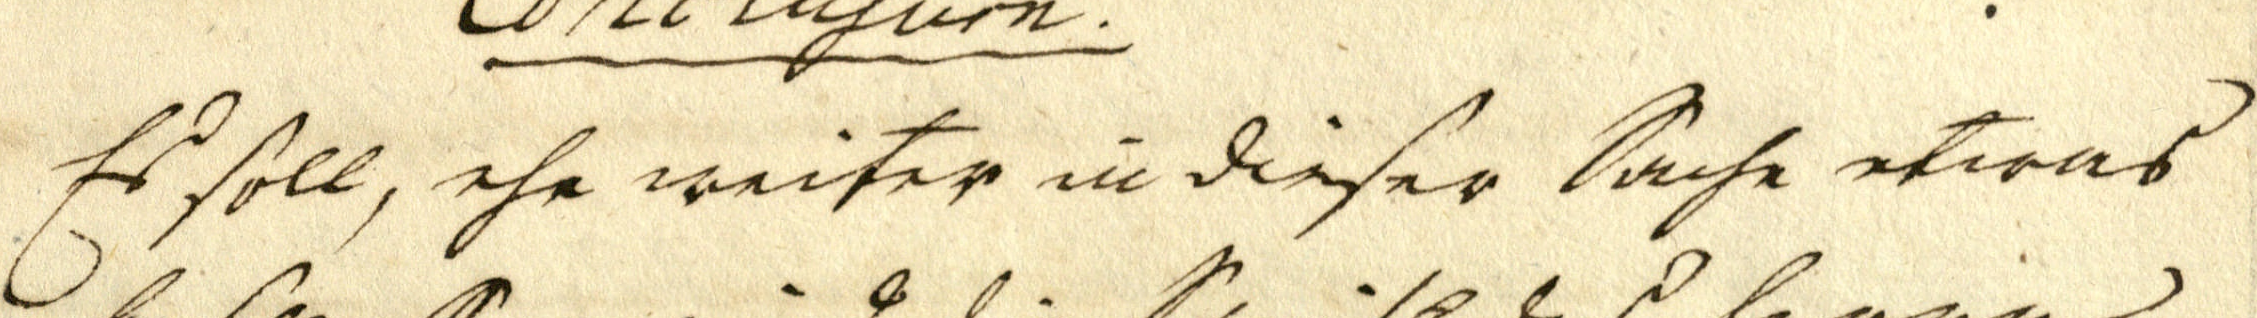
Es soll, ehe weiter in dieser Sache etwas
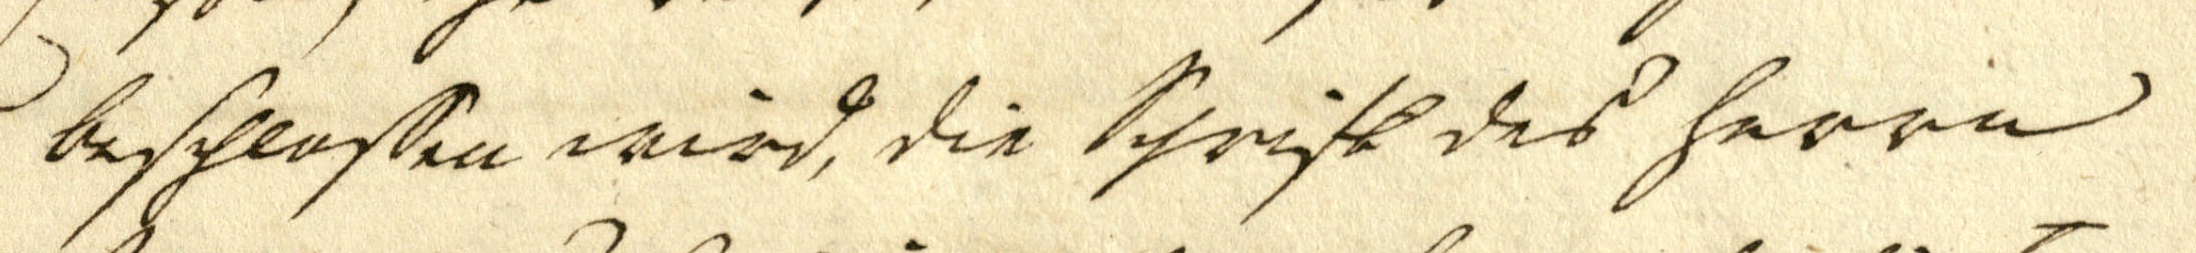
beschlossen wird, die Schrift des herrn
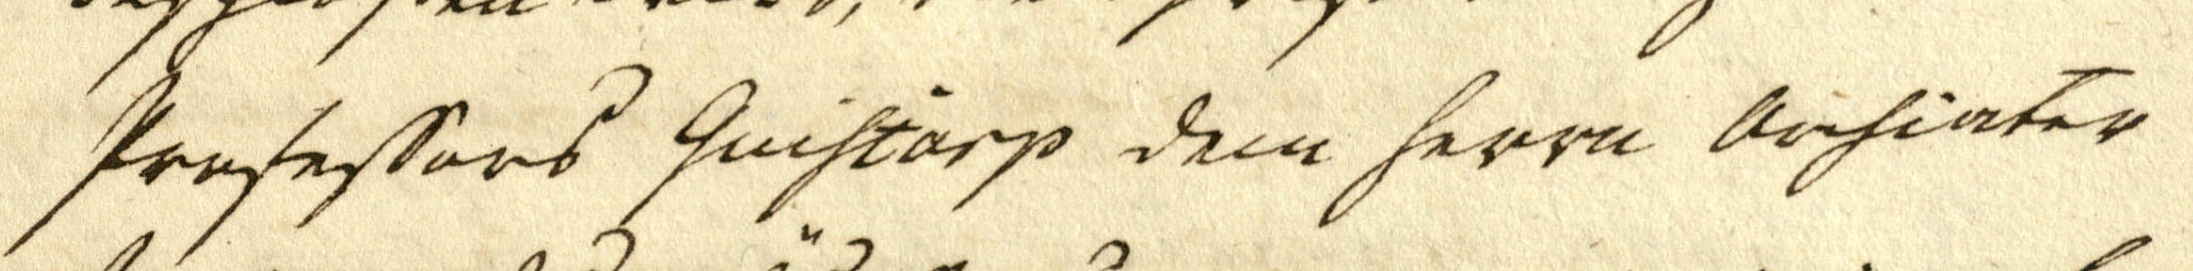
Professors Quistorp dem herrn Archiater
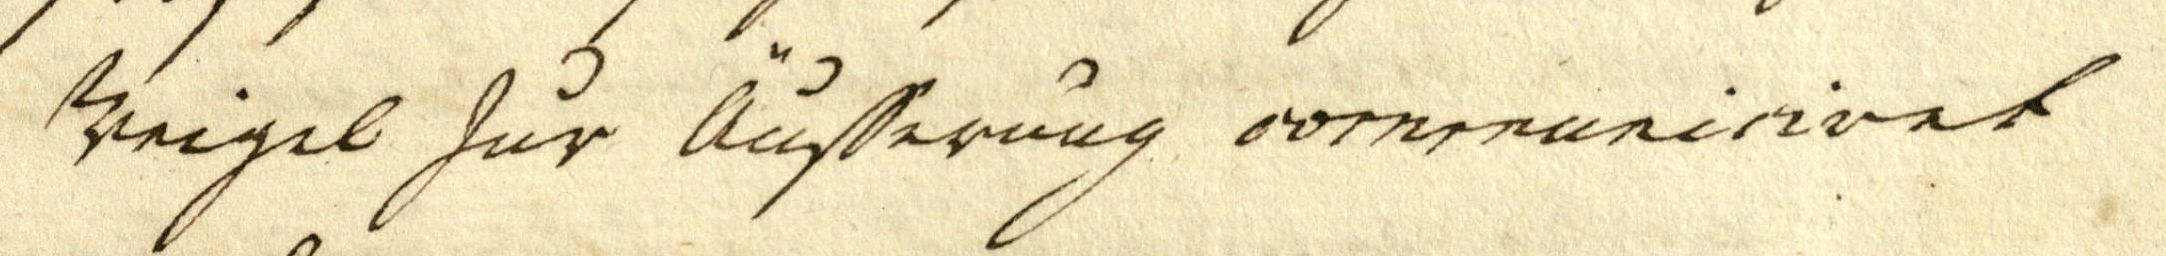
Weigel zur Äusserung communiciret
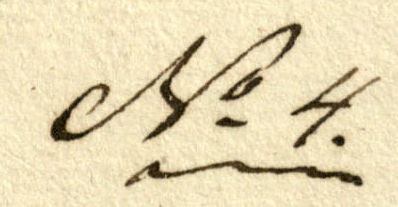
Nº 4.
